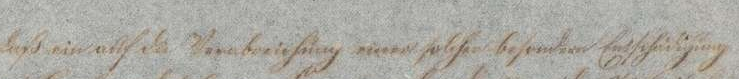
daß ein auf die Verabreichung einer solchen besondern Entschädigung
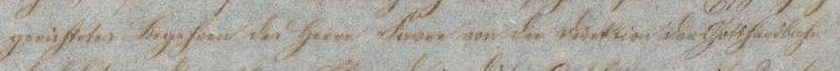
gerichtetes Begehren des Herrn Favre von der Direktion der Gotthardbahn
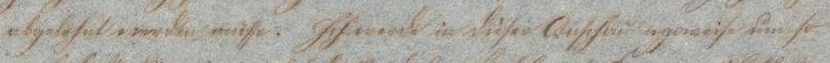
abgelehnt werden müsse. Ich werde in dieser Anschauungsweise um so
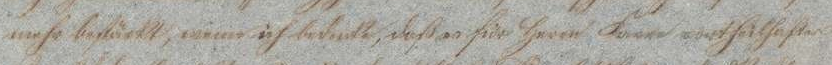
mehr bestärkt, wenn ich bedenke, daß es für Herrn Favre vortheilhafter
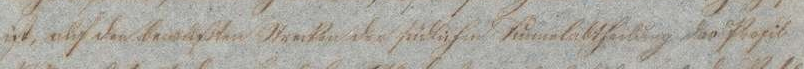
ist, auf den bewußten Strecken der südlichen Tunnelabtheilung das Profil
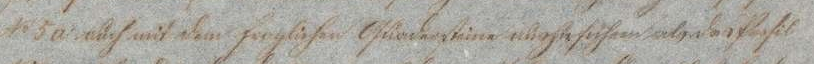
No 5a auch mit dem fraglichen Quadersteine auszuführen als das Profil
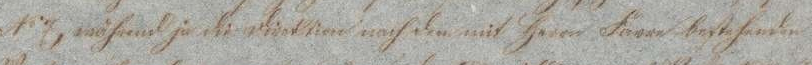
No 7, während ja die Direktion nach dem mit Herrn Favre bestehenden
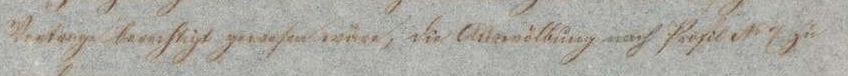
Vertrage berechtigt gewesen wäre, die Auswölbung nach Profil No 7 zu
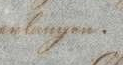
verlangen.
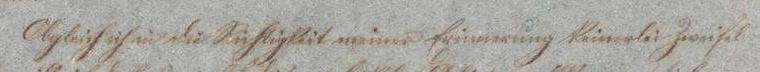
Obgleich ich in die Richtigkeit meiner Erinnerung keinerlei Zweifel
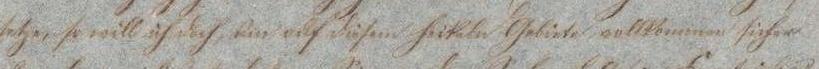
setze, so will ich doch, um auf diesem heikeln Gebiete vollkommen sicher
